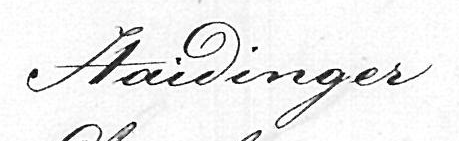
Haidinger
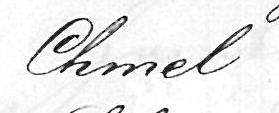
Chmel
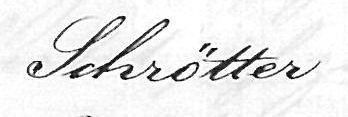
Schrötter
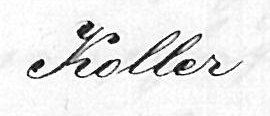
Koller
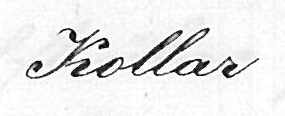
Kollar
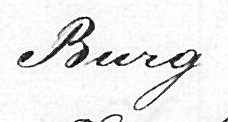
Burg
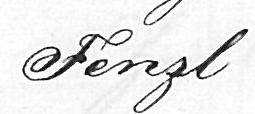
Fenzl
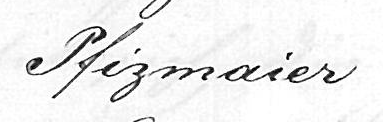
Pfizmaier
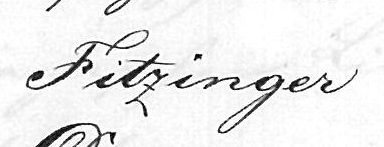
Fitzinger
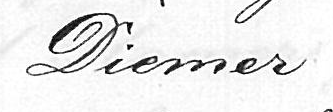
Diemer
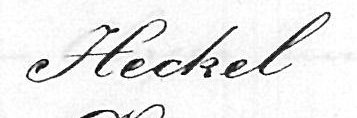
Heckel
